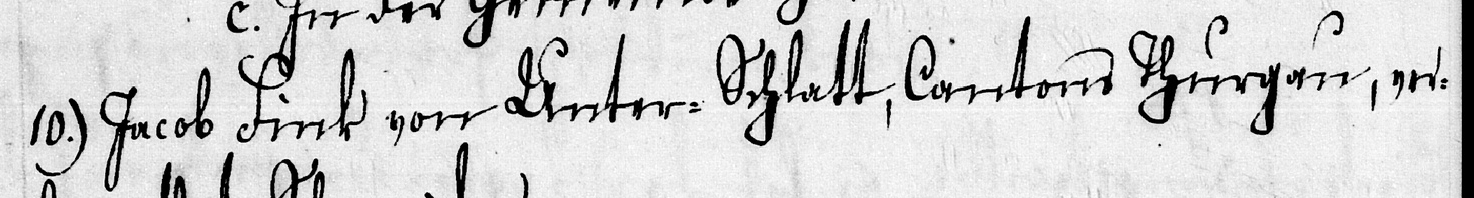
10.) Jacob Fink von Unter-Schlatt, Cantons Thurgau, ver¬
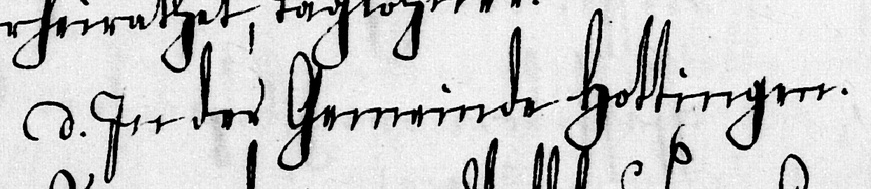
d. In der Gemeinde Hottingen.
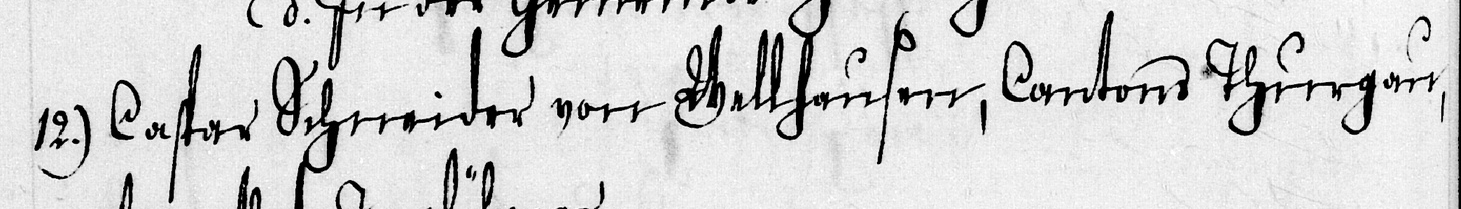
12.) Caspar Schneider von Wellhausen, Cantons Thurgau,
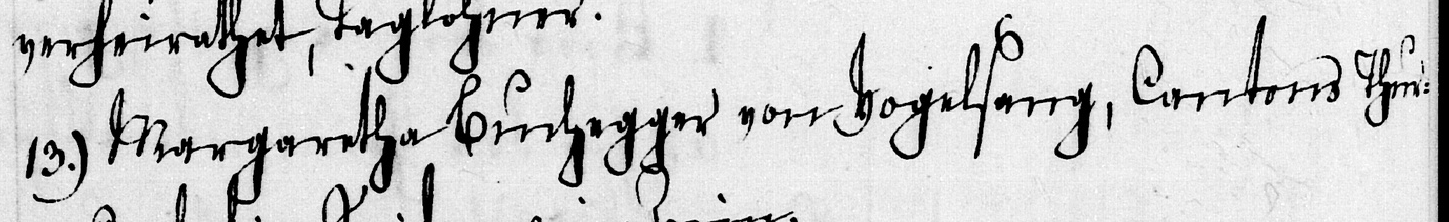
13.) Margaretha Buchegger von Vogelsang, Cantons Thur¬
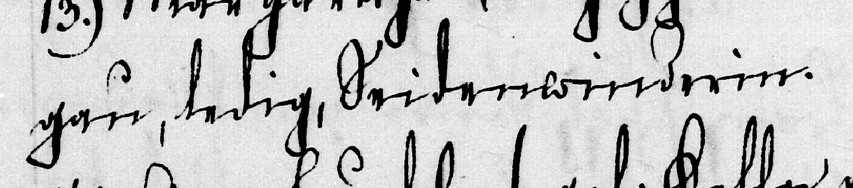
gau, ledig, Seidenwinderin.
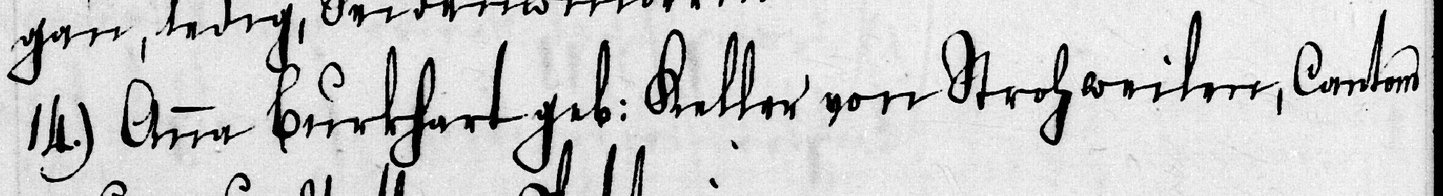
14.) Anna Burkhart geb: Keller von Strohweilen, Cantons
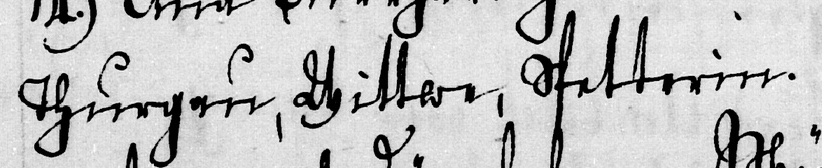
Thurgau, Wittwe, Spetterin.
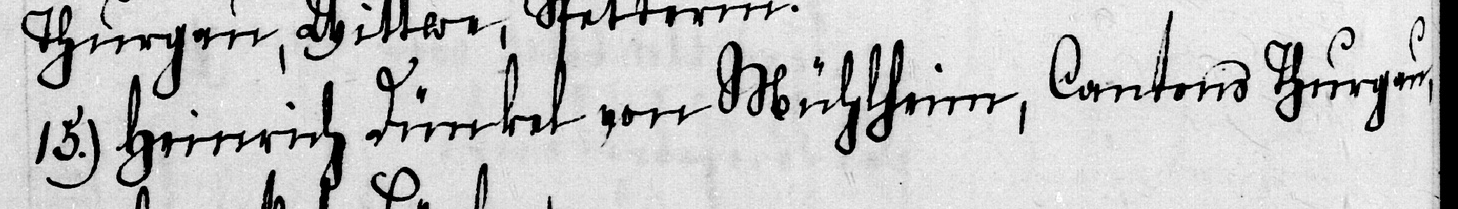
15.) Heinrich Dünkel von Mühlheim, Cantons Thurgau,
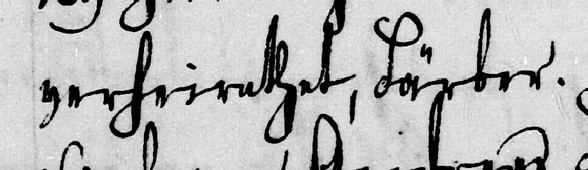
verheirathet, Färber.
